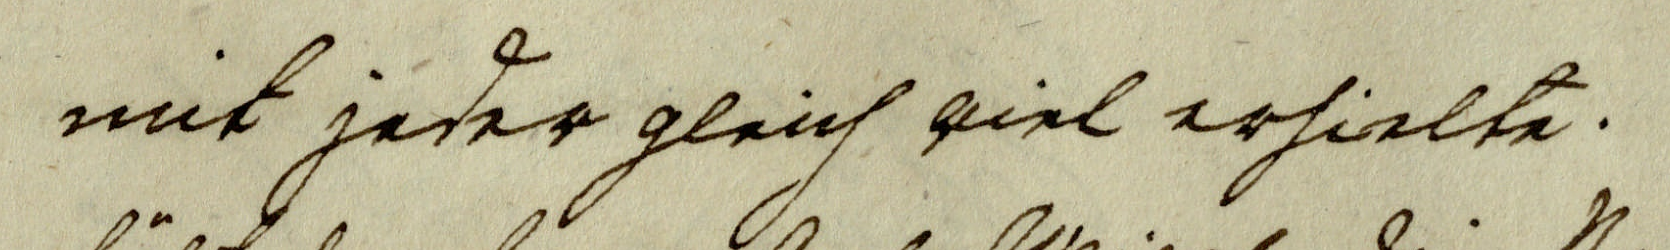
mit jeder gleich viel erhielte.
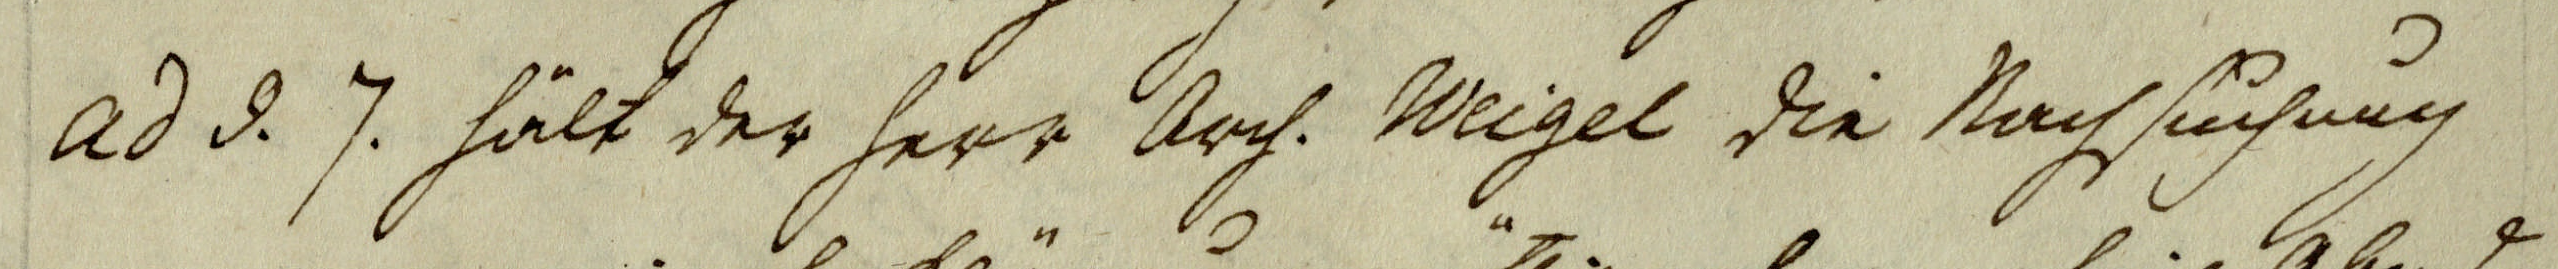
ad §. 7. hält der Herr Arch. Weigel die Nachsuchung
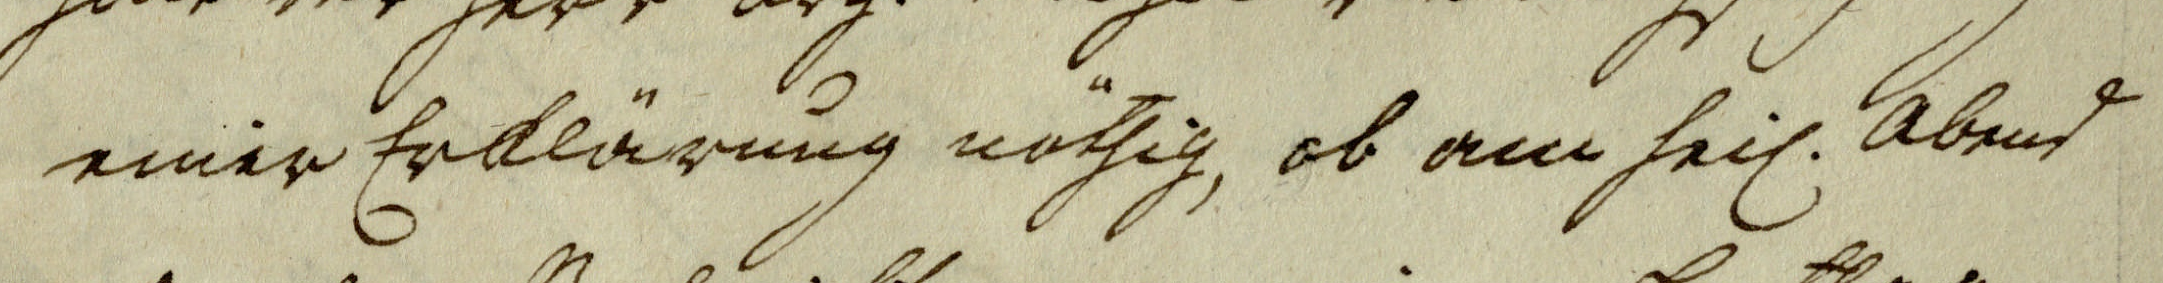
einer Erklärung nöthig, ob am heil. Abend
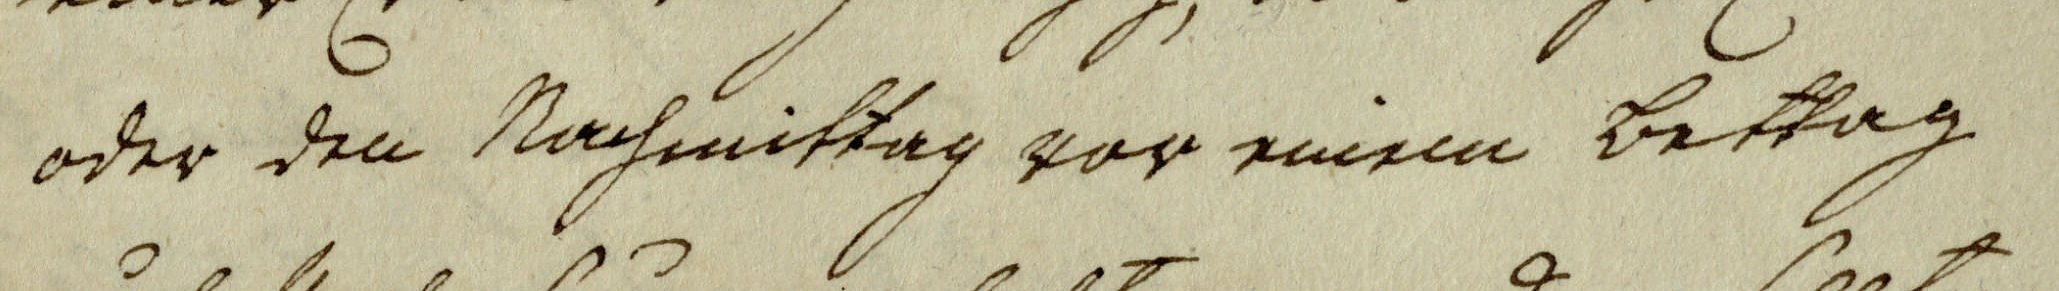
oder den Nachmittag vor einem Bettag
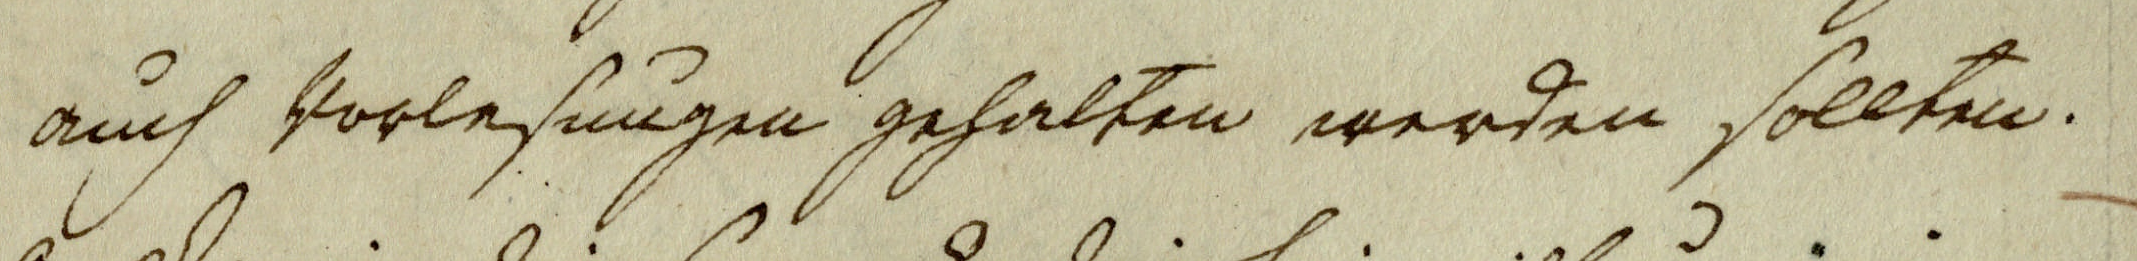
auch Vorlesungen gehalten werden sollten.
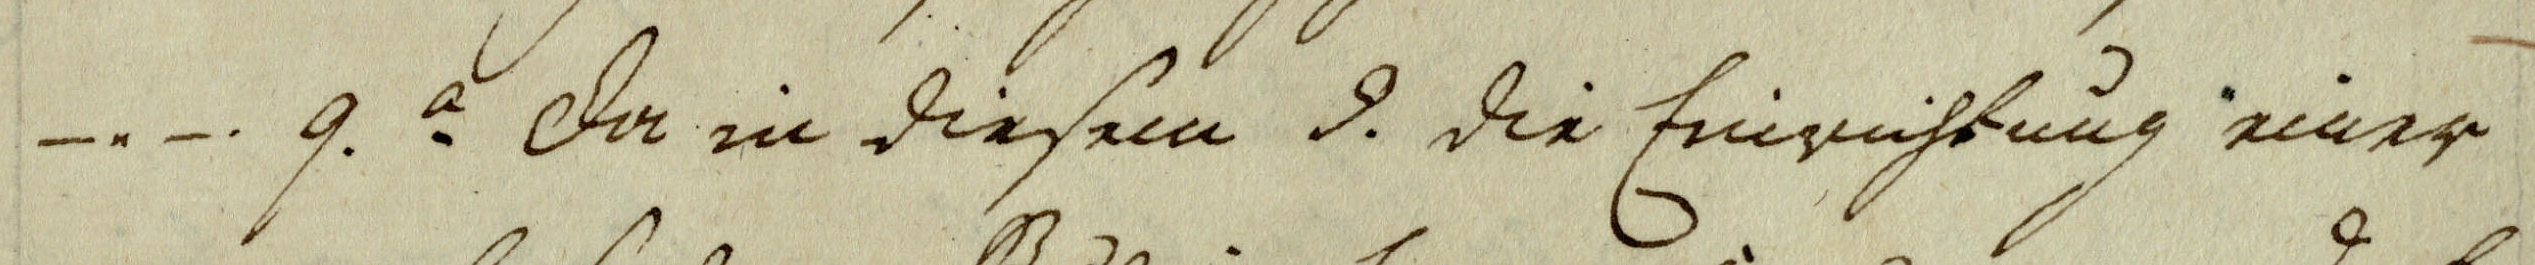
9. a. Da in diesem §. die Einrichtung einer
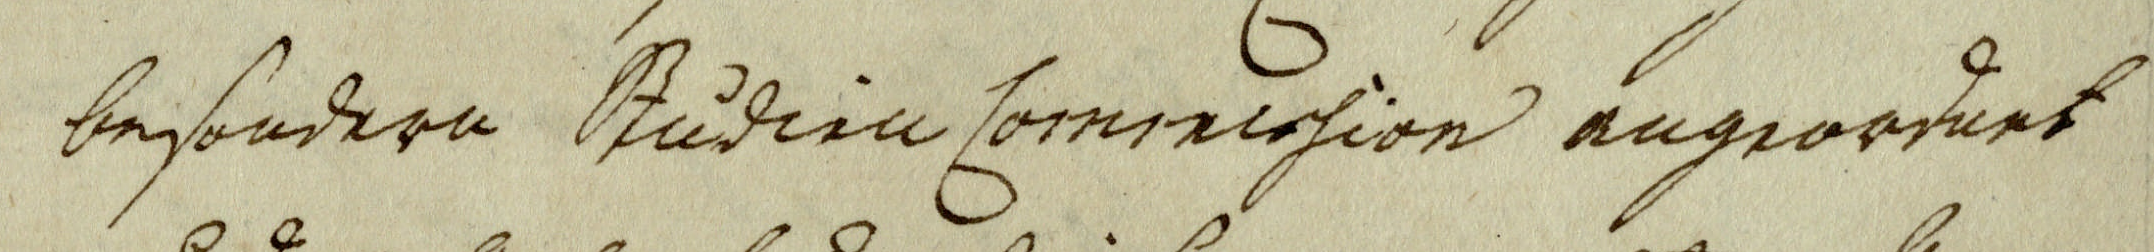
besondern Studien Commission angeordnet
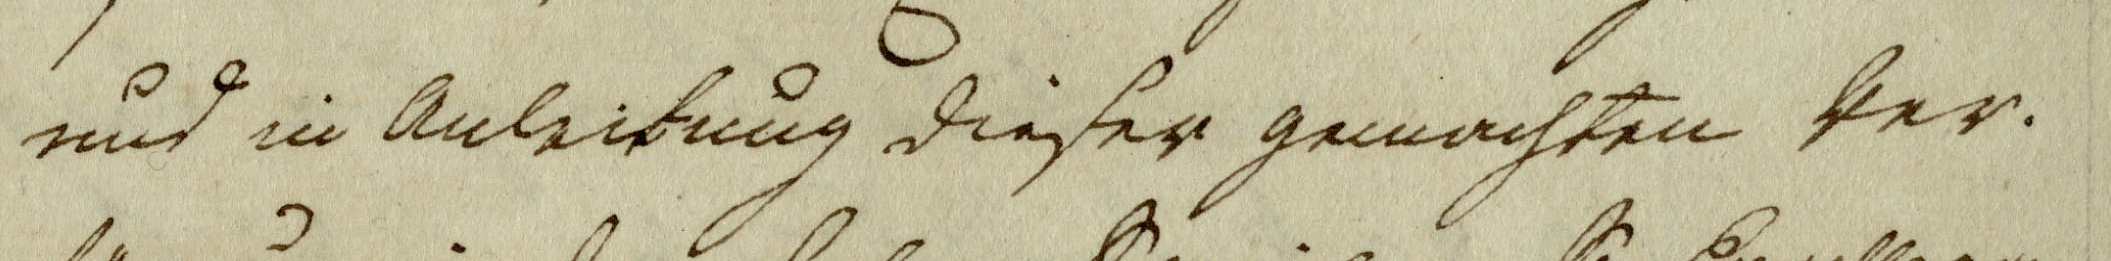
und in Anleitung dieser gemachten Ver¬
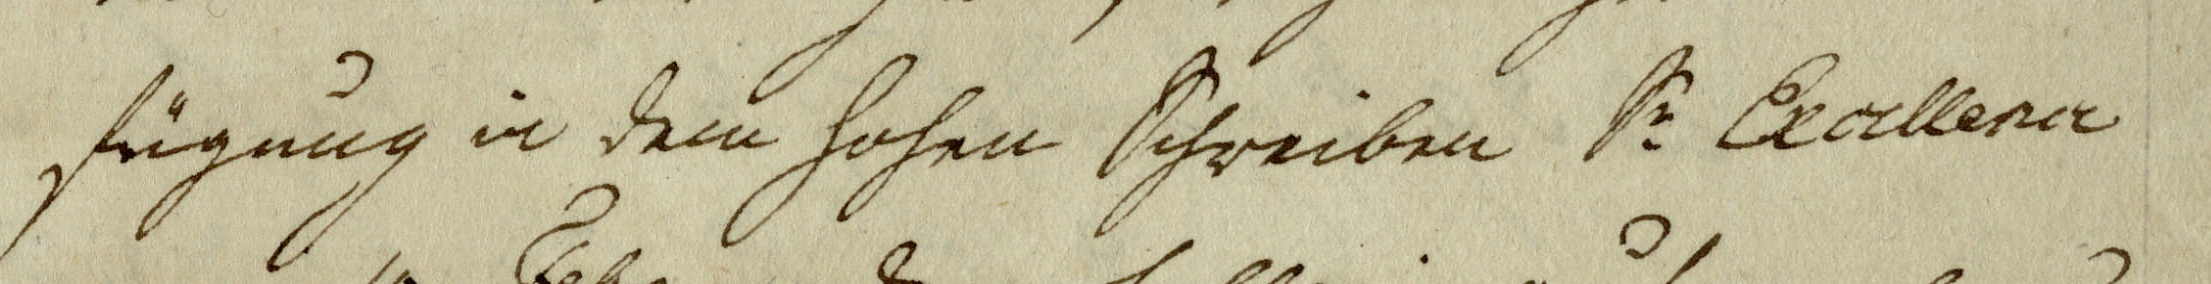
fügung in dem hohen Schreiben Sr Excellence
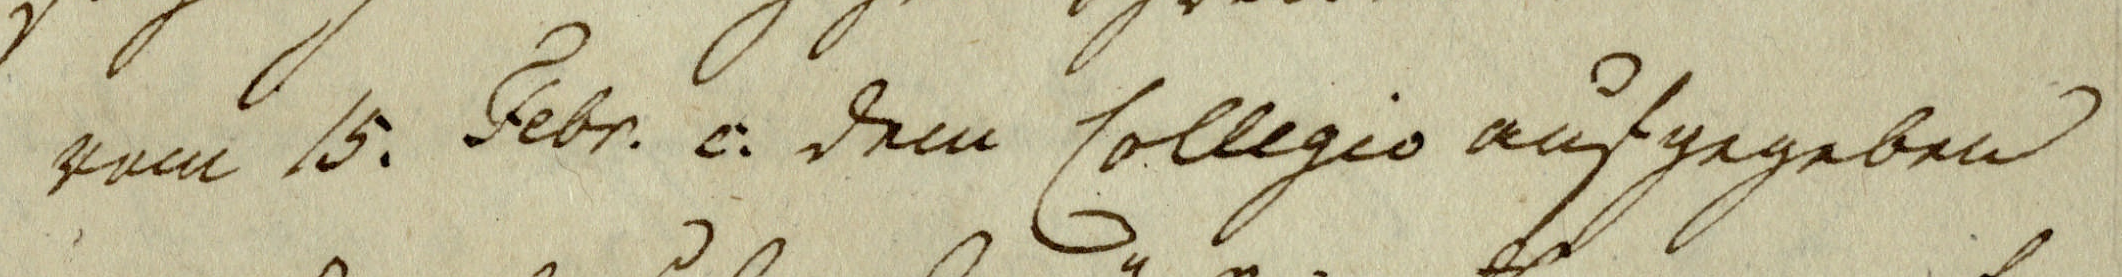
vom 15. Febr. c. dem Collegio aufgegeben
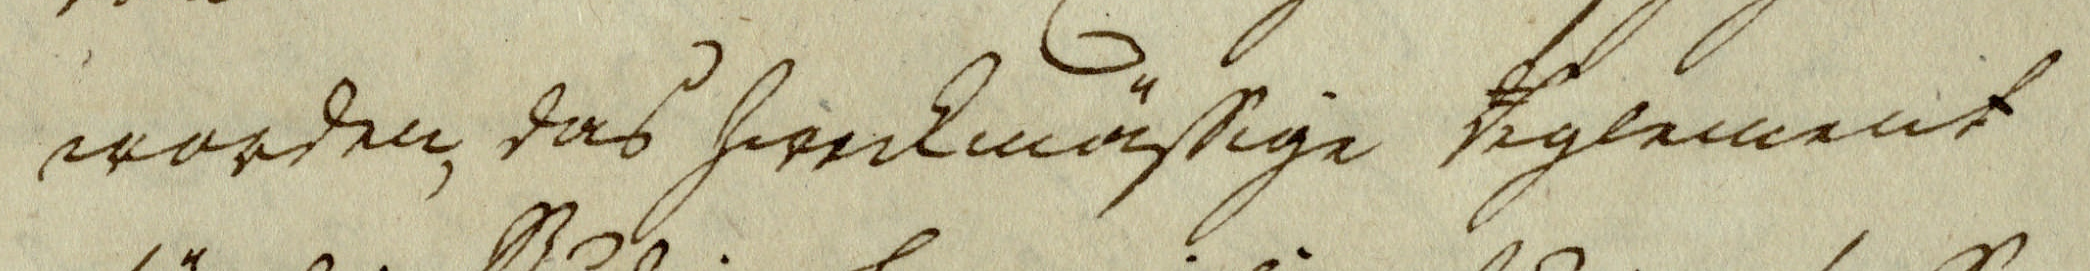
worden, das zweckmässige Reglement
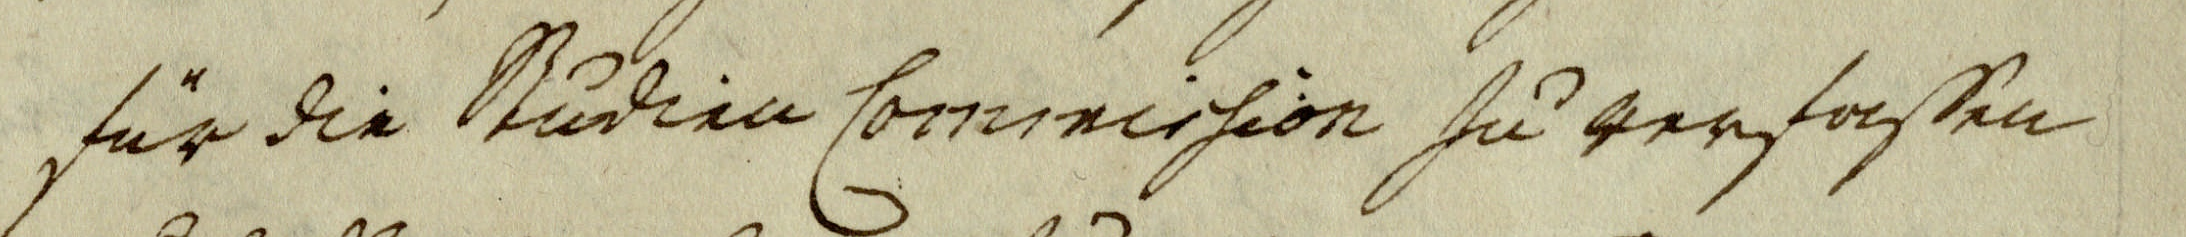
für die Studien Commission zu verfassen
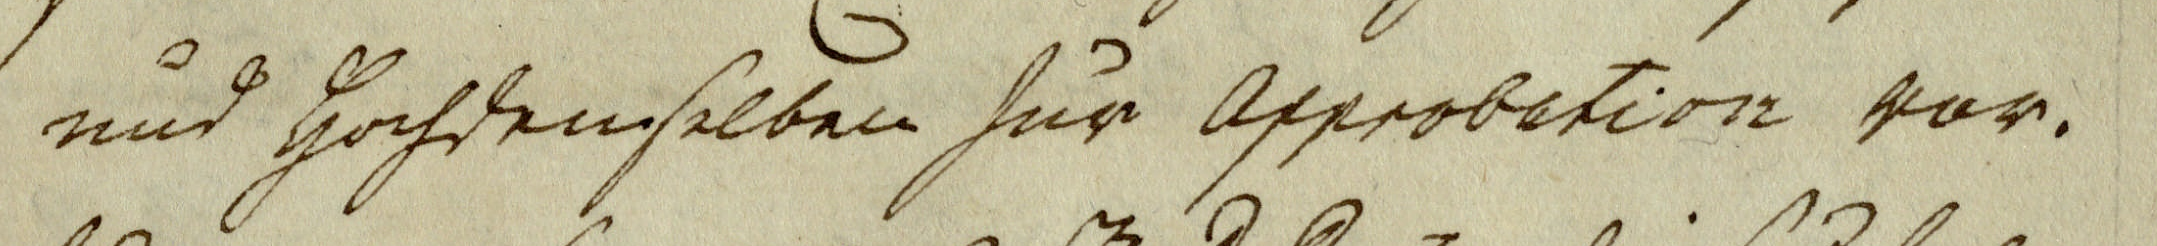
und Hochdenselben zur Approbation vor¬
